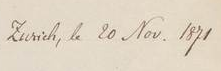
Zurich, le 20 Nov. 1871
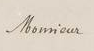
Monsieur
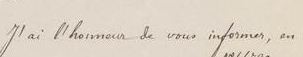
J'ai l'honneur de vous informer, en
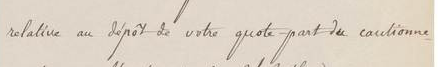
relative au dépôt de votre quote-part du cautionne-
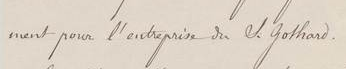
ment pour l'entreprise du S. Gothard.
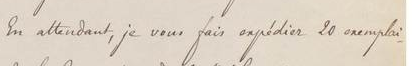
En attendant, je vous fais expédier 20 exemplai-
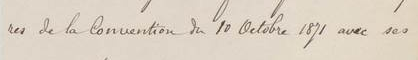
res de la Convention du 10 Octobre 1871 avec ses
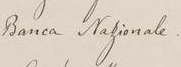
Banca Nazionale.
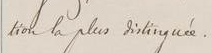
tion la plus distinguée.
